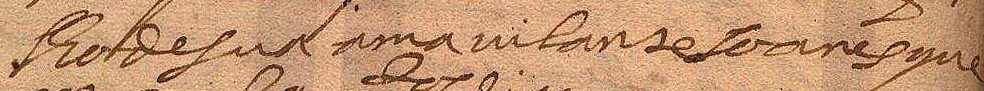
lho de sua ama uilante soares que
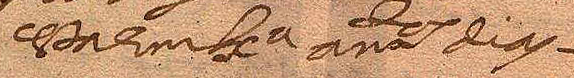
esta Em lxa a mtos dias
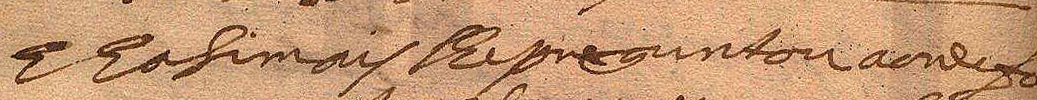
E E asi mais lhe preguntou aonde fo
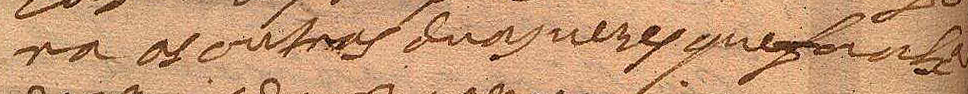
ra as outras duas uezes que foi a Lxa
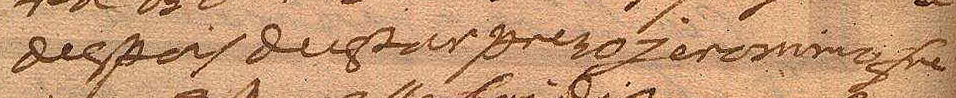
despois de estar prezo jeronimo fre
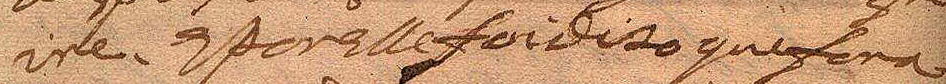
ire. E por Elle foi dito que fora
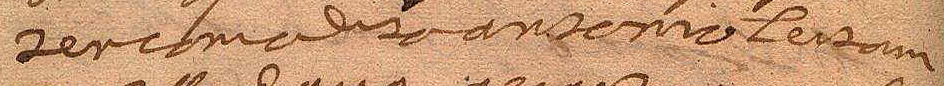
ter com o dito antonio Leitam
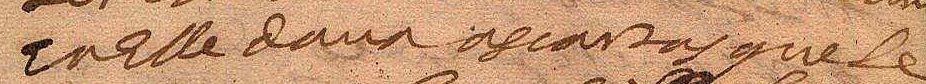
E a Elle daua as cartas que le
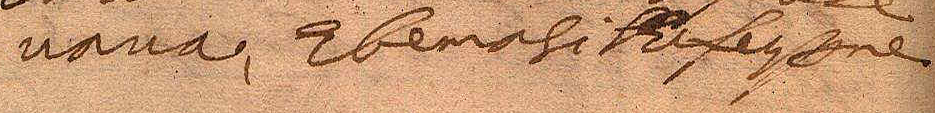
uaua, E bem asi lhe fez pre
